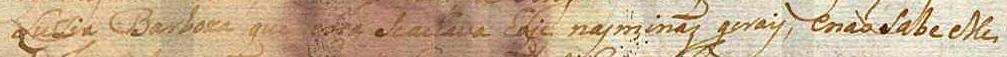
Luzia Barboza que essa se achaua hoje nas minas gerais, e naõ sabe elle
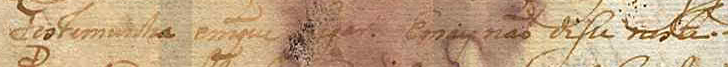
testemunha em que lugar. E mais naõ disse neste.
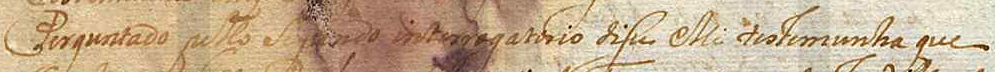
Perguntado pello segundo interrogatorio disse elle testemunha que
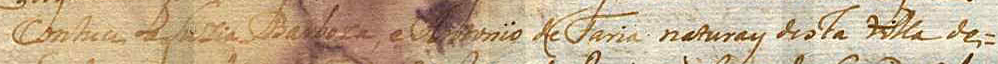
Conhece da Luzia Barboza, e Antonio de Faria naturaes desta Villa de
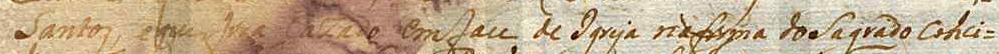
Santos, e que fora Cazado em face de Igreja na forma do Sagrado conci
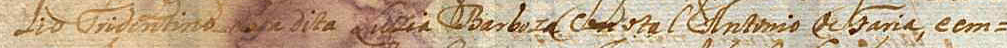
Lio Tridentino dita Luzia Barboza con o tal Antonio de Faria, e em
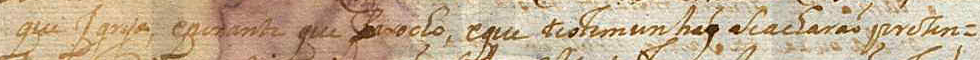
que Jgreja, e perante que Parrocho, e que testemunha q̄ se acharaõ prezen
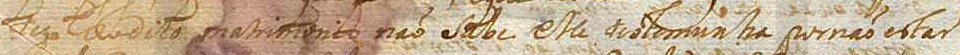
tes ao dito matrimonio naõ sabe elle testemunha por naõ estar
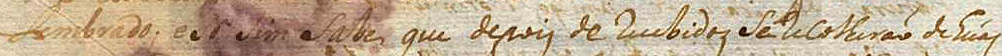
Lembrado; e só sim Sabe que depois de Recebidos se Recolheraõ de huās
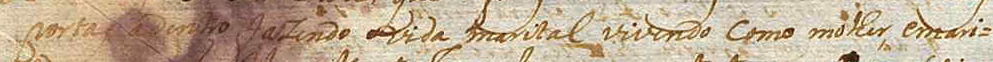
portas adentro fazendo vida marital vivendo como molher, e mari
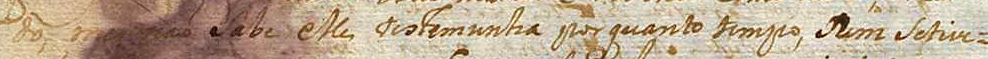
do, mas naõ sabe elle testemunha por quanto tempo, nem se tive
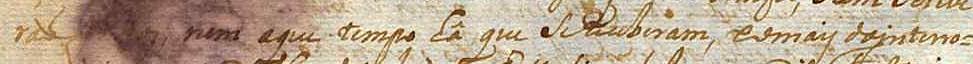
raõ f os, nem a que tempo hâ que se Receberam, e o mais do interro
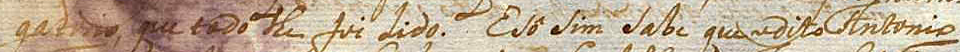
gatorio, que todo lhe foi Lido. E sô sim sabe que o dito Antonio
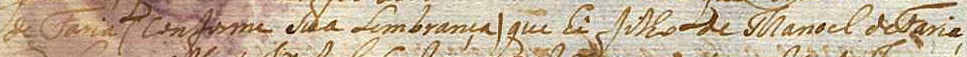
de Faria (Conforme sua Lembrança) que hêé filho de Manoel de Faria,
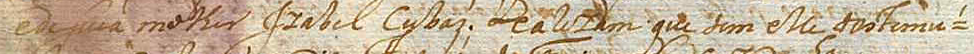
e de sua molher Jzabel Cubas; e a Rezam que tem elle testemu
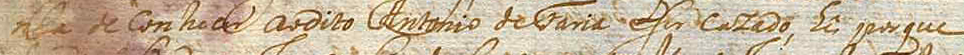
nha de conhecer ao dito Antonio de Faria e ser cazado, hê porque
